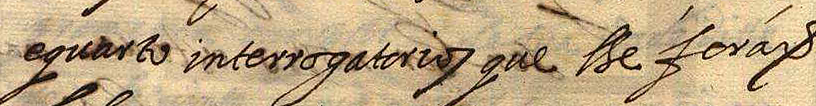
e quarto interrogatorios que lhe foraõ
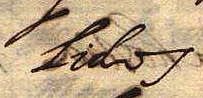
lidos
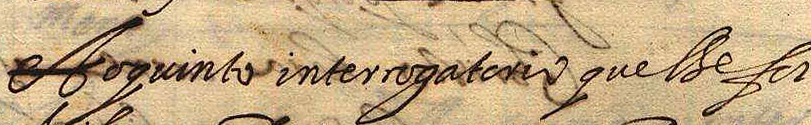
Ao quinto interrogatorio que lhe foi
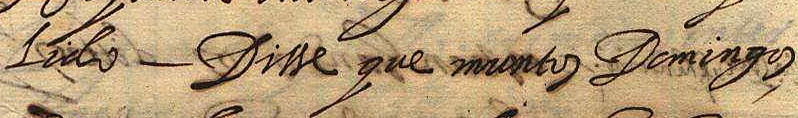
Lido – Disse que muntos Domingos
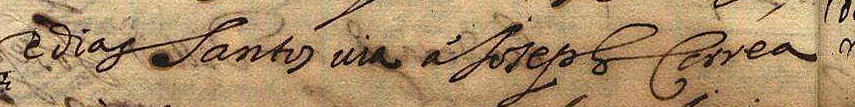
e dias Santos uia á Joseph Correa
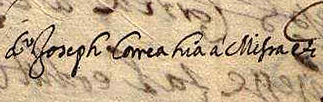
do Jozeph Correa hia á Missa &c
